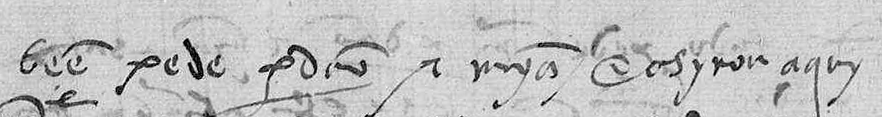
beē pedē ꝑdão a myā e asynou aquy
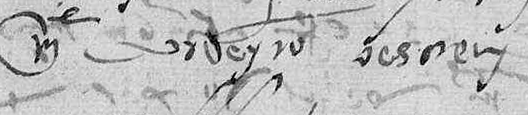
mel cordeyro o escreuy
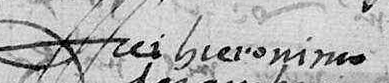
frei hieronimo
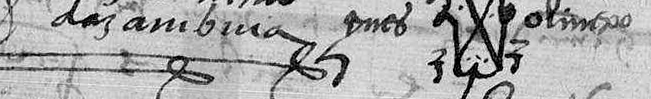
dazambuia ynes olimpo
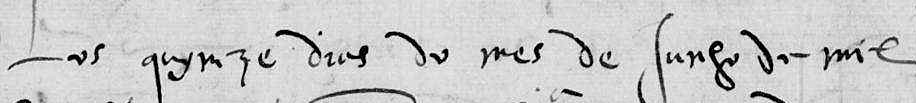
Aos quynze dias do mes de Junho de mil
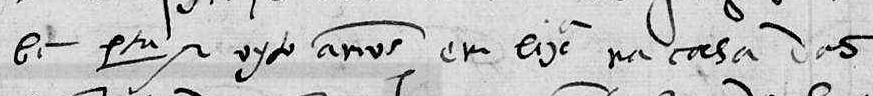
bc Lta e oyto an̄os em lixa na casa das
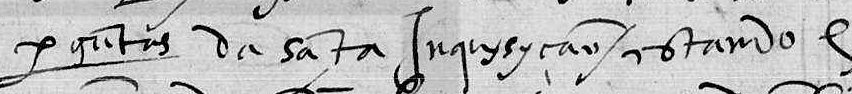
ꝑgutas da sa̅ta Jnquysyção / estando hy
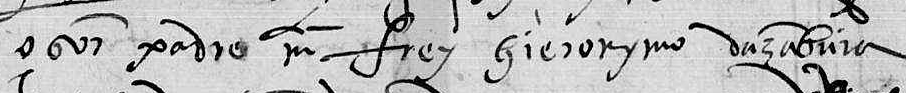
o sōr padre mte frey hieronymo dazābuia
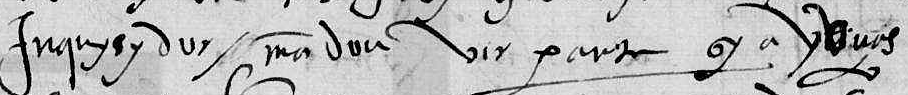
Jnquysydor mādou vir ꝑante sy a yuas
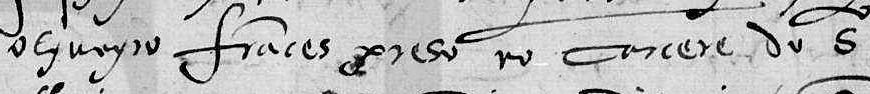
olyueyro frāces preso no Carcere do Sto
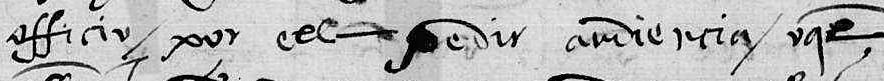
officio / por elle pedir auiencia / o q̄l
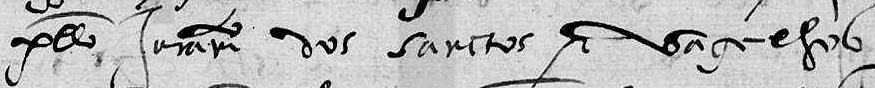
pllo Juramto dos sanctos eva̅gelhos
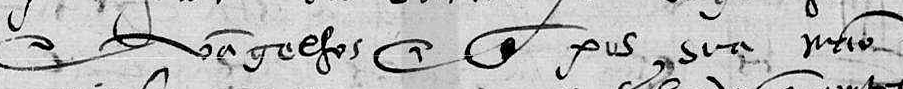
evāgelhos ē q̅ pos sua mão
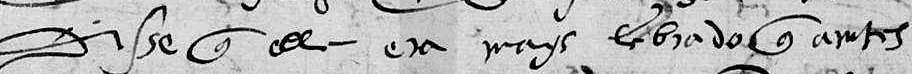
disse q̅ elle era mays lēbrado q̄ amtes
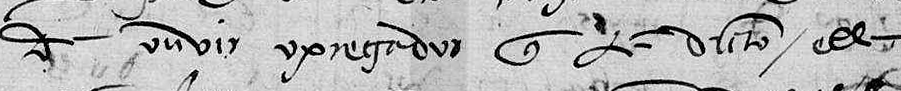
de ouvir o pregador q̄ tē dicto / elle
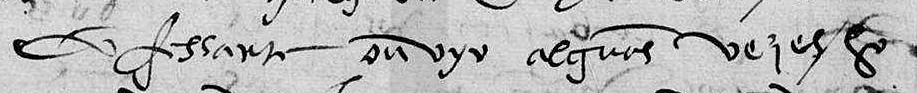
Co̅fessante ouvyo algu̅as vezes ho
